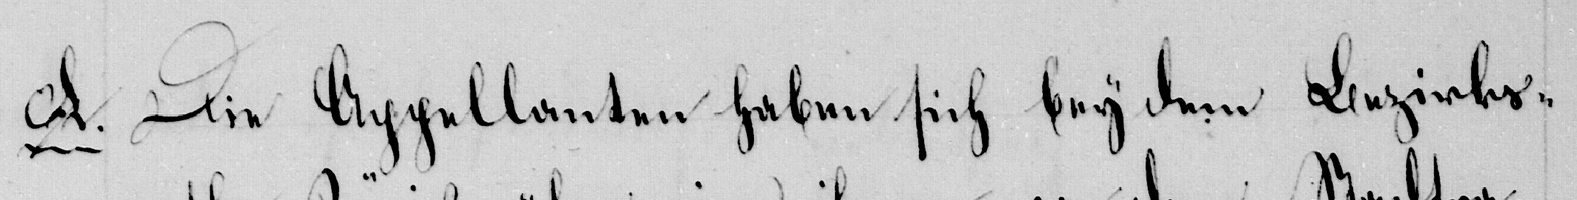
A. Die Appellanten haben sich bey dem Bezirks¬
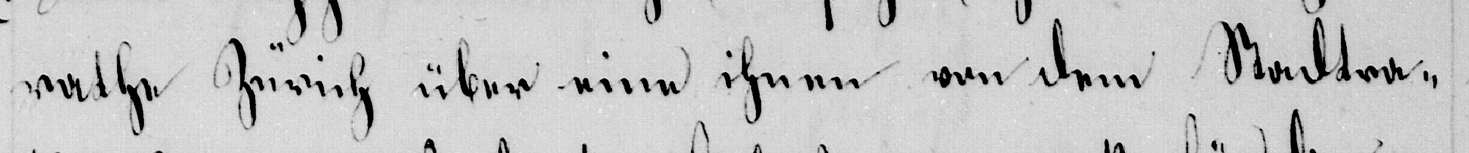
rathe Zürich über eine ihnen von dem Stadtra¬
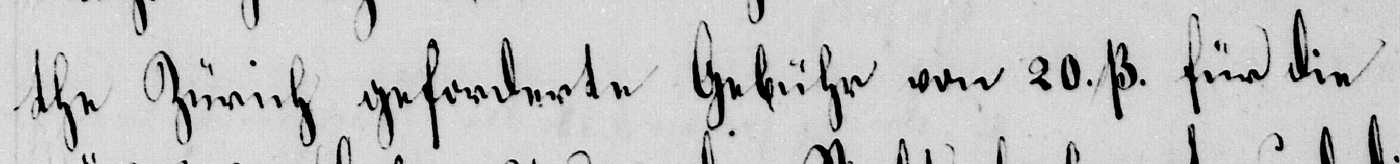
the Zürich geforderte Gebühr von 20. ß. für die
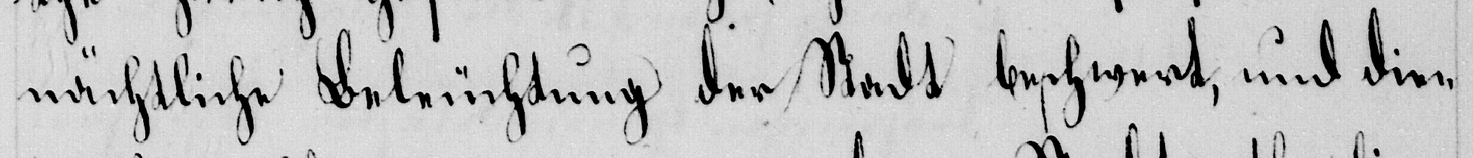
nächtliche Beleuchtung der Stadt beschwert, und die¬
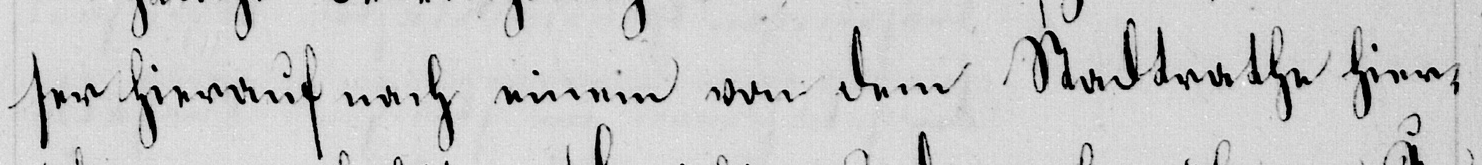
ser hierauf nach einem von dem Stadtrathe hier¬
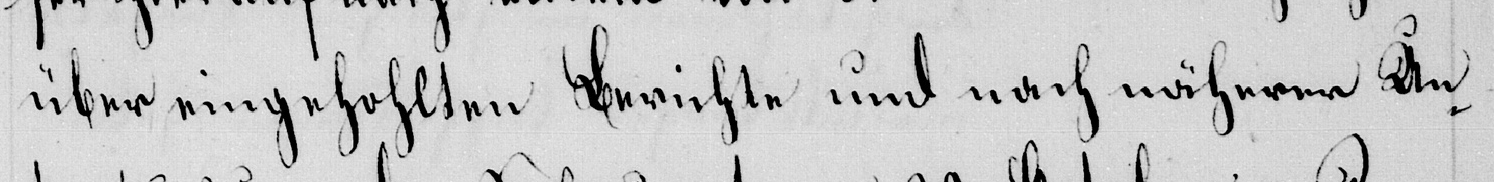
über eingehohlten Berichte und nach näherer Un¬
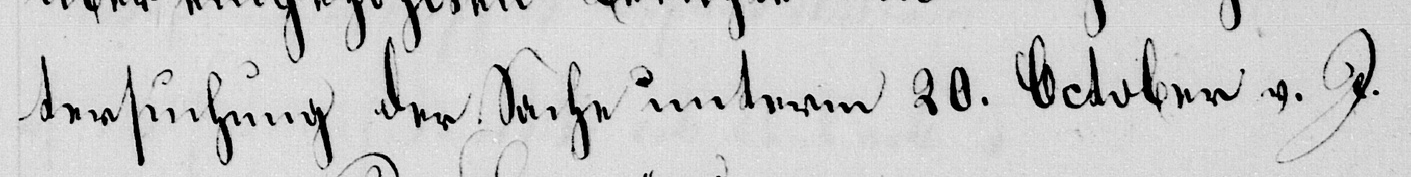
tersuchung der Sache unterm 20. October v. J.
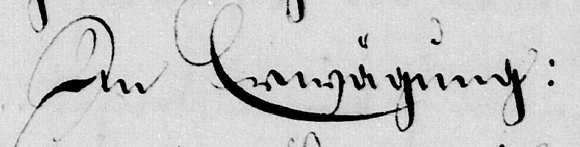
In Erwägung:
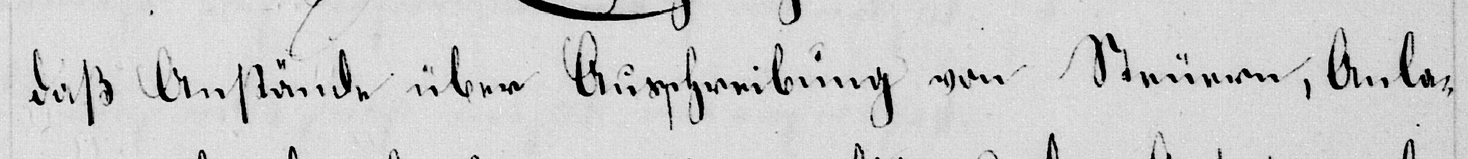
daß Anstände über Ausschreibung von Steuern, Anla¬
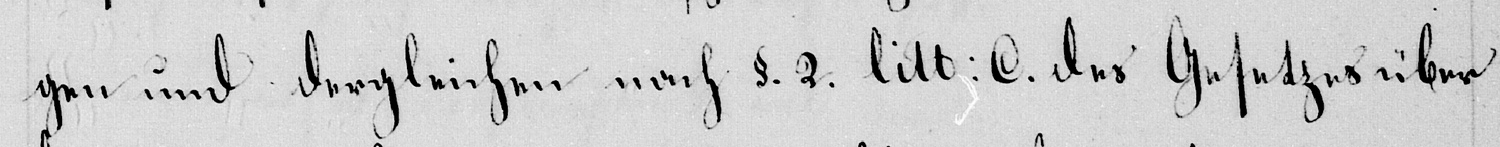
gen und dergleichen nach §. 2. litt: C. des Gesetzes über
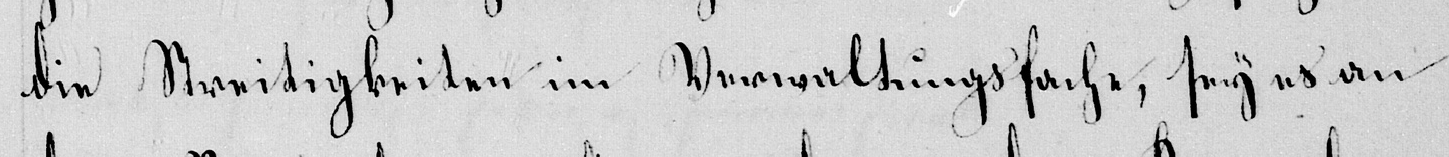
die Streitigkeiten im Verwaltungsfache, sey es an
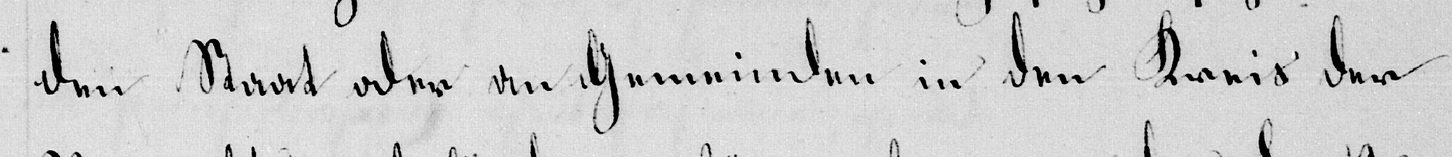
den Staat oder an Gemeinden in den Kreis der
